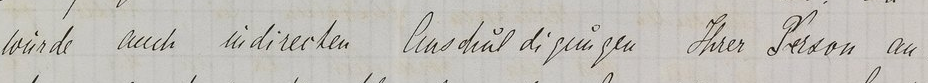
würde auch indirecten Anschuldigungen Ihrer Person an-
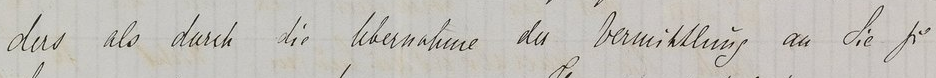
ders als durch die Übernahme der Vermittlung an Sie zu
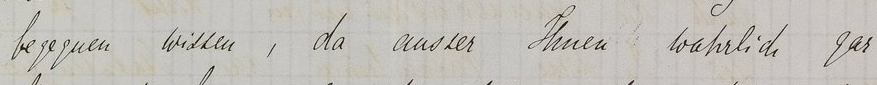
begegnen wissen, da ausser Ihnen wahrlich gar
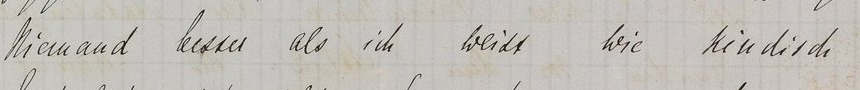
niemand besser als ich weiss wie kindisch
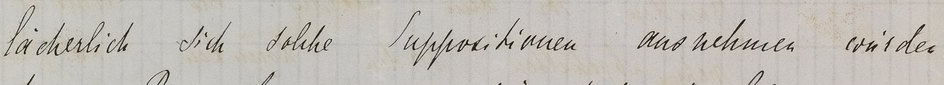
lächerlich sich solche Suppositionen ausnehmen würden.
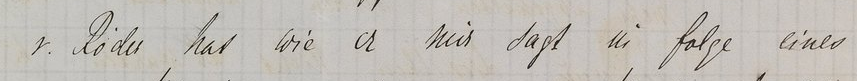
v. Röder hat wie er mir sagt in Folge eines
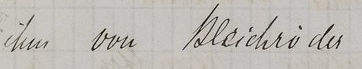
ihm von Bleichröder
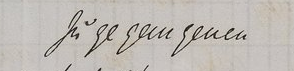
zugegangenen
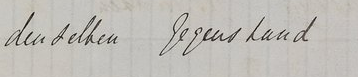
denselben Gegenstand
